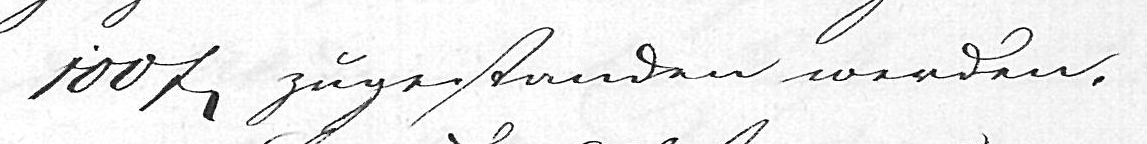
100 fr zugestanden werden.
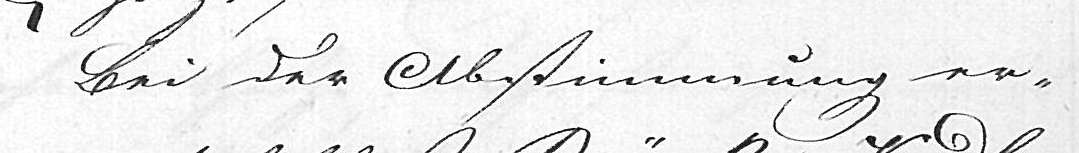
Bei der Abstimmung er-
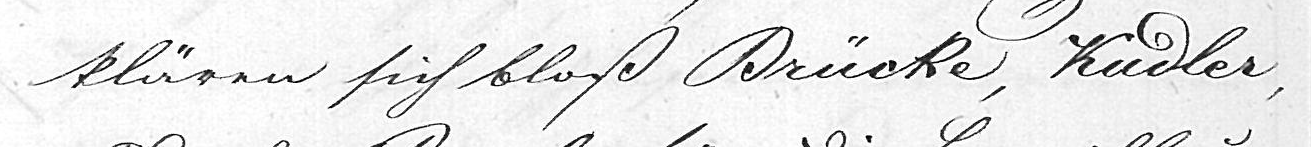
klären sich bloß Brücke, Kudler,
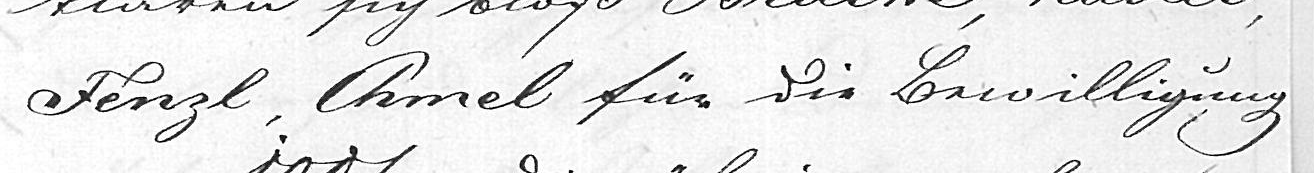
Fenzl, Chmel für die Bewilligung
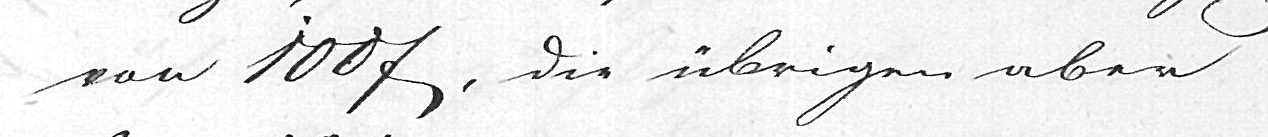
von 100 fl, die übrigen aber
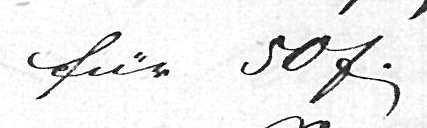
für 50 fl.
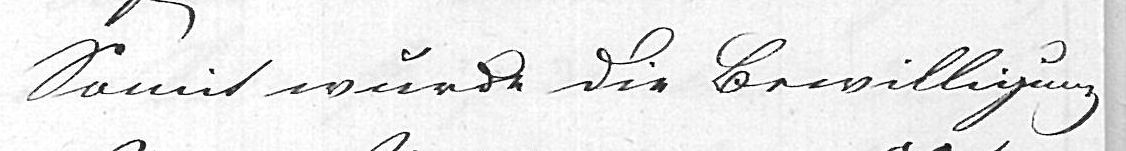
Somit wurde die Bewilligung
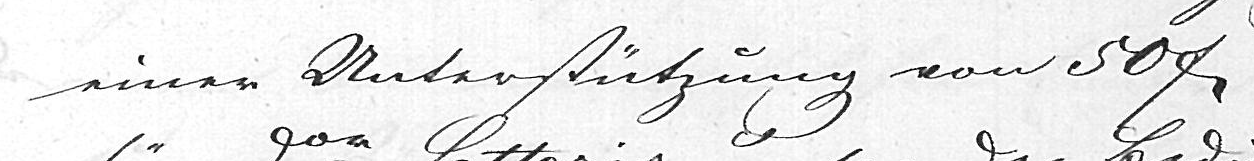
einer Unterstützung von 50 fr
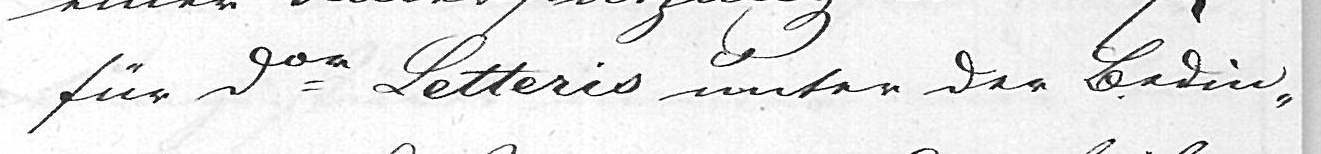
für Dor Letteris unter der Bedin-
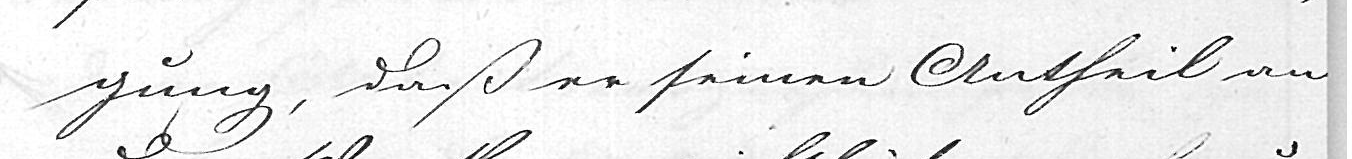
gung, daß er seinen Antheil an
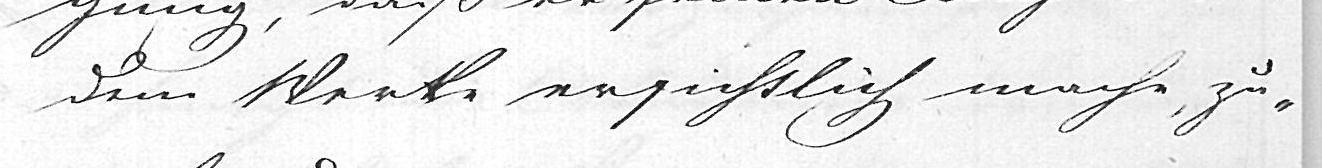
dem Werke ersichtlich mache, zu-
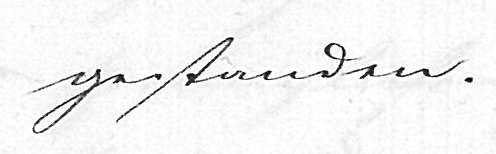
gestanden.
